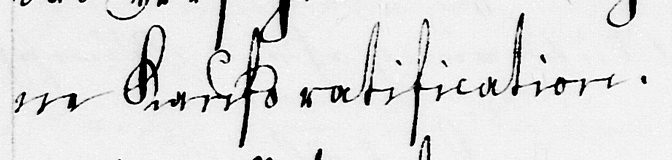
ne Kaufsratification.
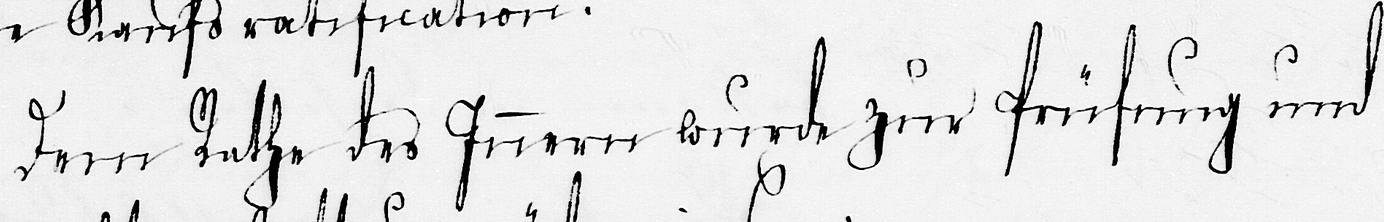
Dem Rathe des Innern wurde zur Prüfung und
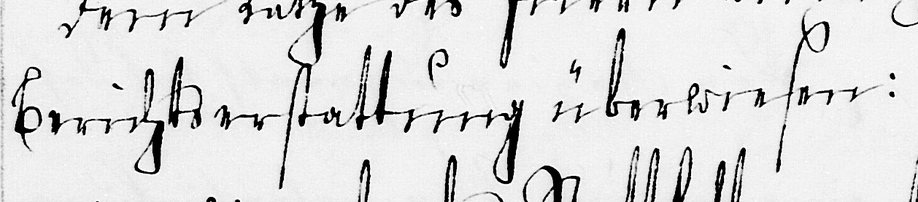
Berichtserstattung überwiesen:
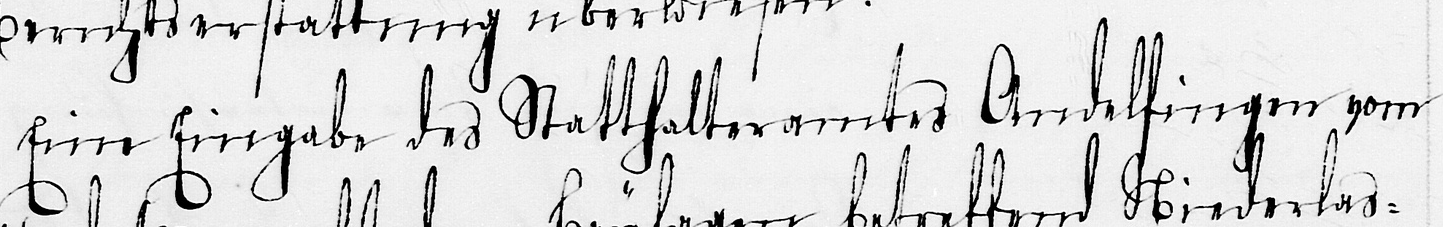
Eine Eingabe des Statthalteramtes Andelfingen vom
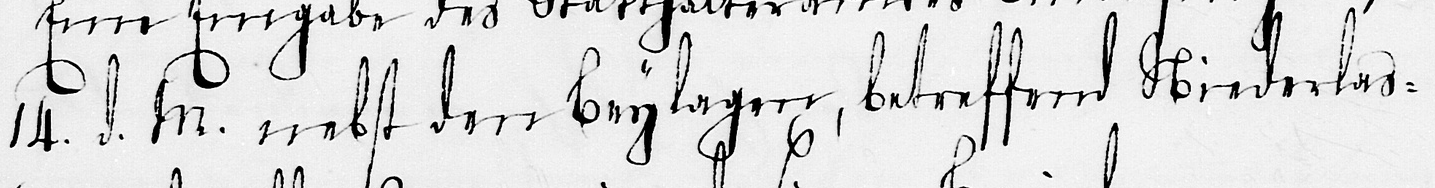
14. d. M. nebst den Beylagen, betreffend Niederlaß¬
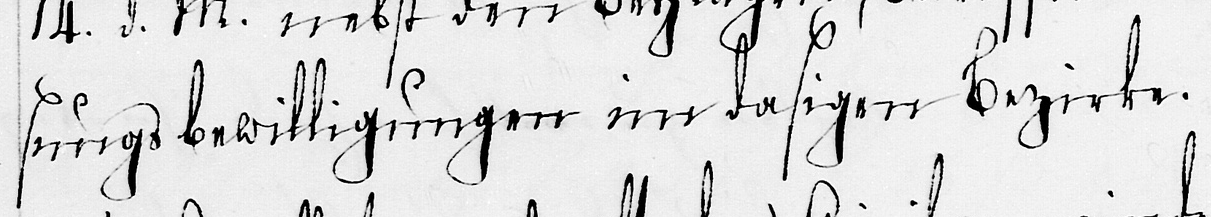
ungsbewilligungen im dasigen Bezirke.
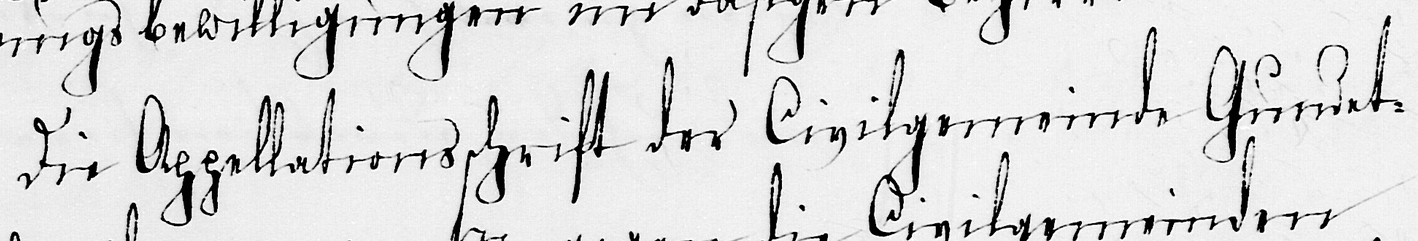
Die Appellationsschrift der Civilgemeinde Gundets¬
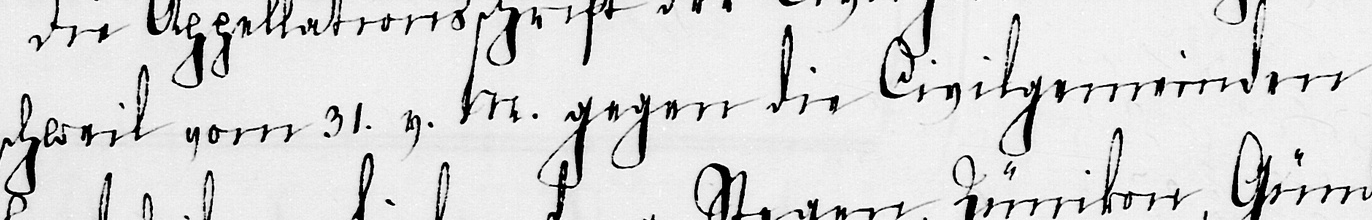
chweil vom 31. v. M. gegen die Civilgemeinden
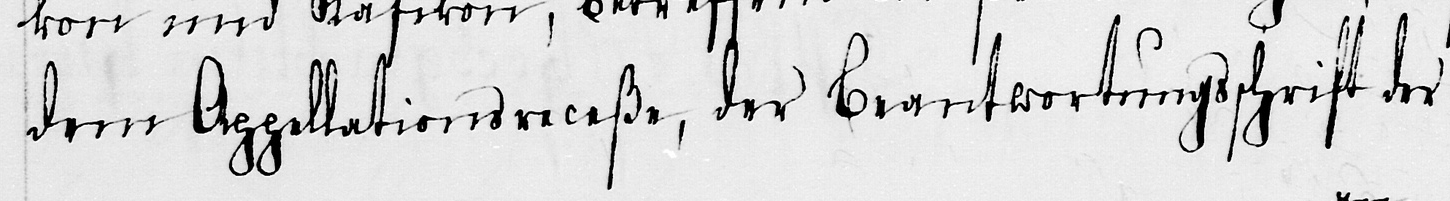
dem Appellationsreceße, der Beantwortungsschrift der
